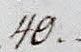40
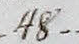48
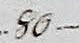80
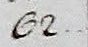62
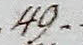49
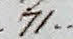71
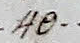40
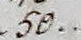50
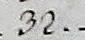32
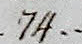74
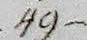49
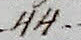44
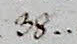38
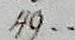49
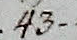43
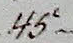45
